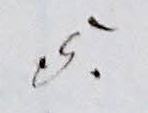5.
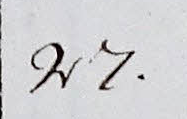27.
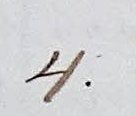4.
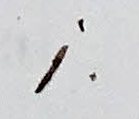1.
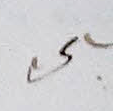5
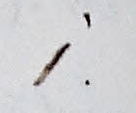1.
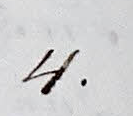4.
